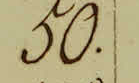50.
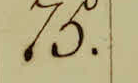75.
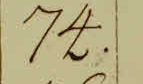74.
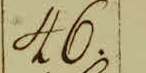46.
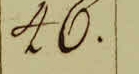46.
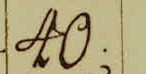40.
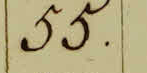55.
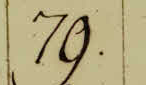79.
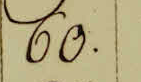60.
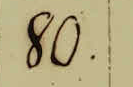80.
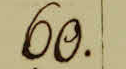60.
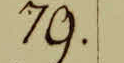79.
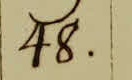48.
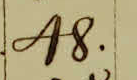48.
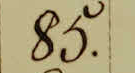85.
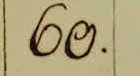60.
